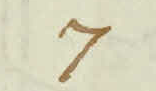7
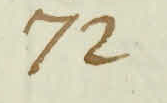72
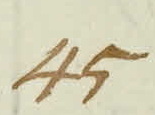45
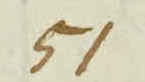51
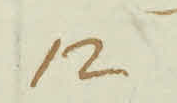12
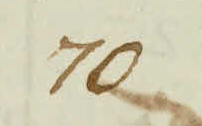70
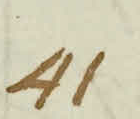41
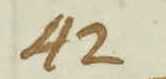42
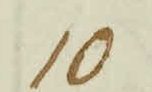10
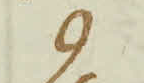9
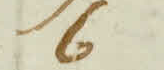6
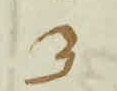3
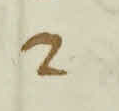2
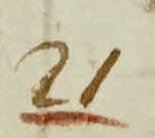21
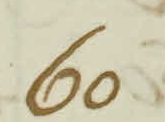60
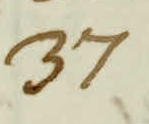37
